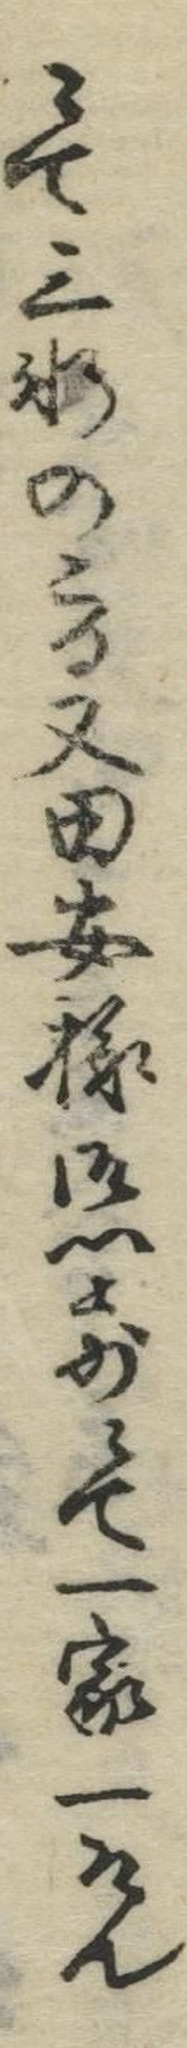にて三軒のこる又田安様御門前にて一家一けん
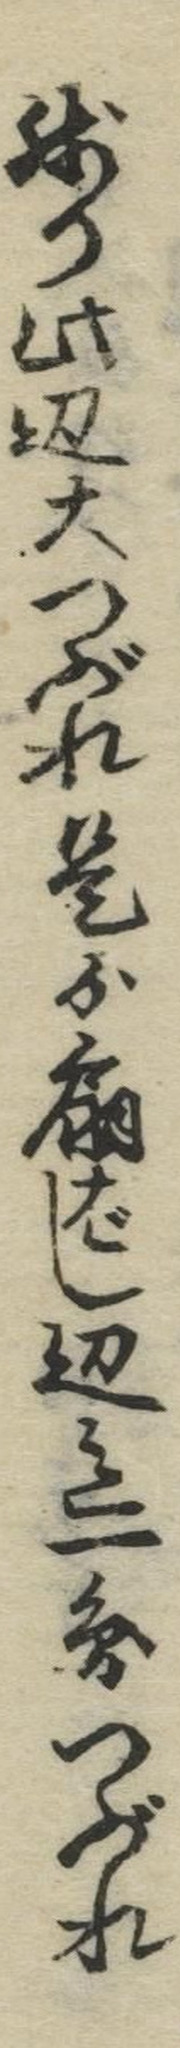残り此辺大つぶれ是ゟ扇ばし辺迄一円つぶれ
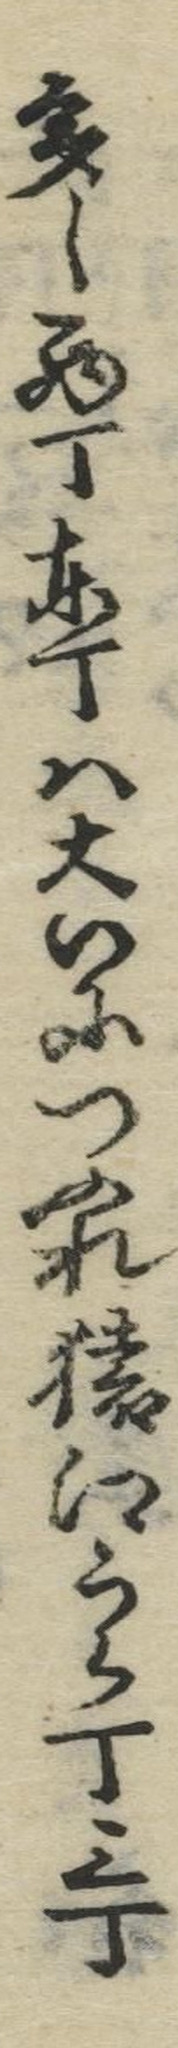多し西丁東丁ハ大いにつふれ猿江うら丁三丁
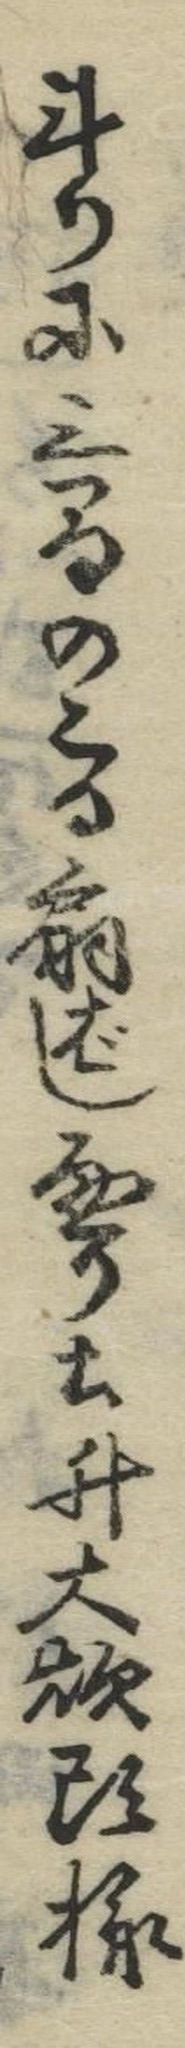斗りに三間のこる扇ばし通り土井大炊頭様
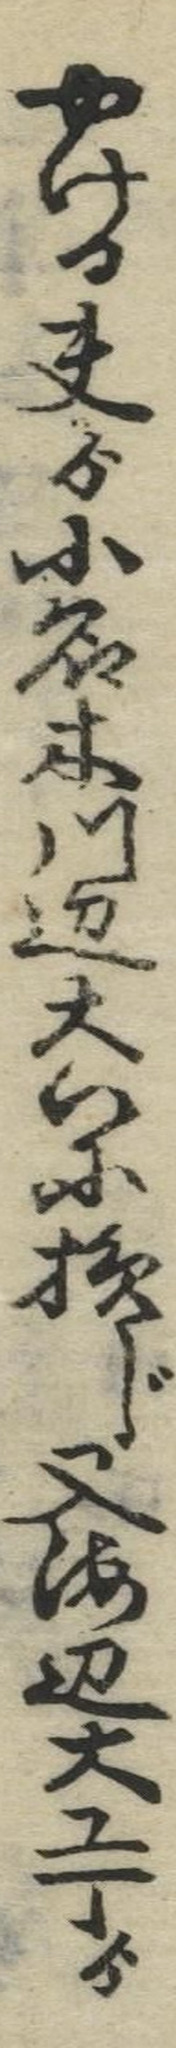やける夫ゟ小名木川辺大いに損じ又海辺大工丁ゟ
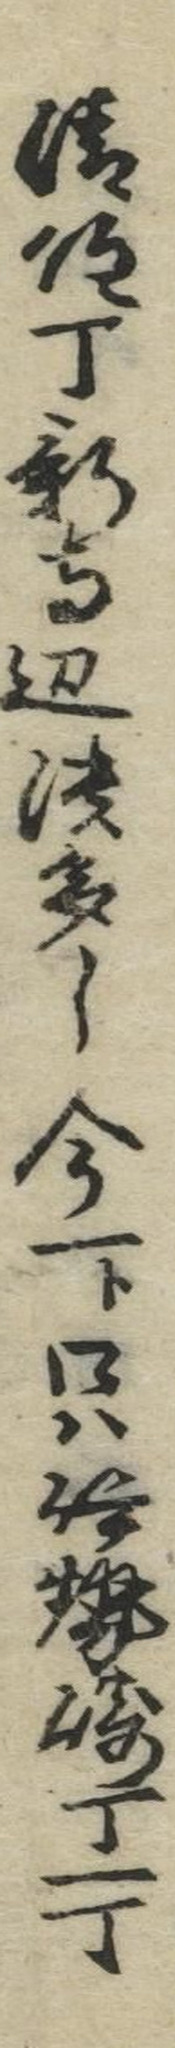清住丁新寺辺潰多し今一ㇳ口ハ伊勢崎丁一丁
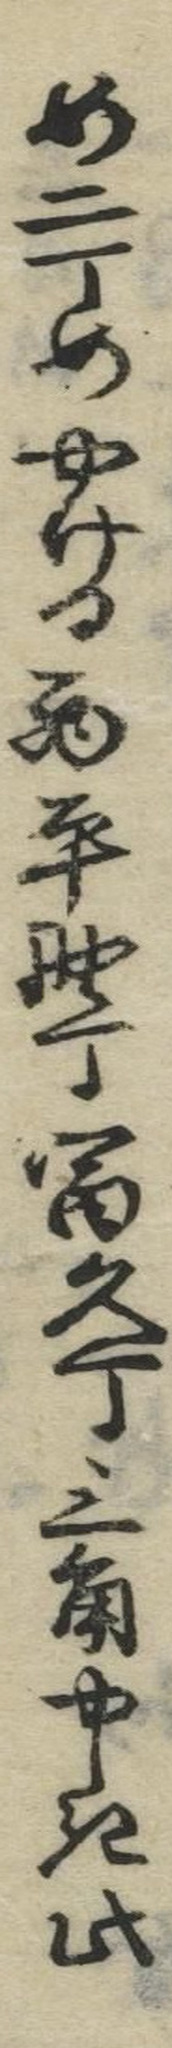め二丁めやける西平野丁冨久丁三角やしき此
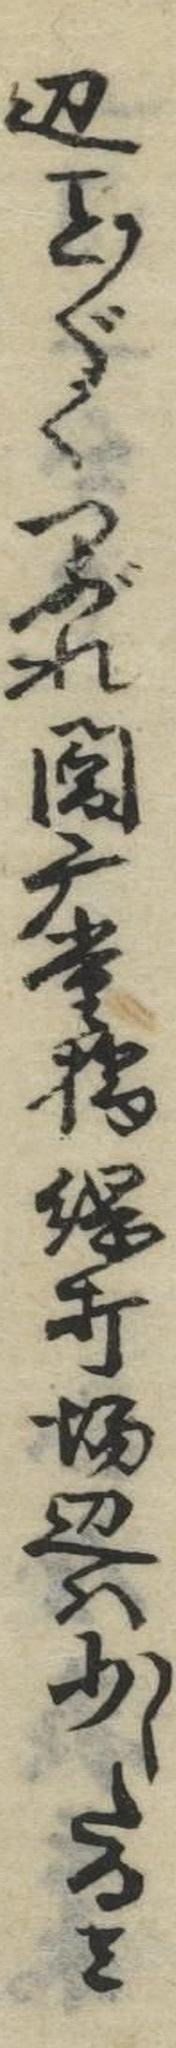辺こと〴〵くつぶれ閻魔堂橋綱打場辺ハ少したるミ
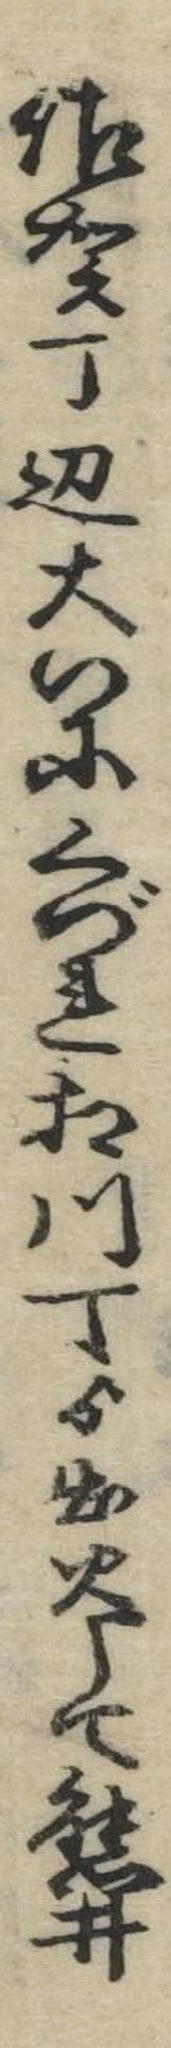佐賀丁辺大いにくづれ相川丁ゟ出火して熊井
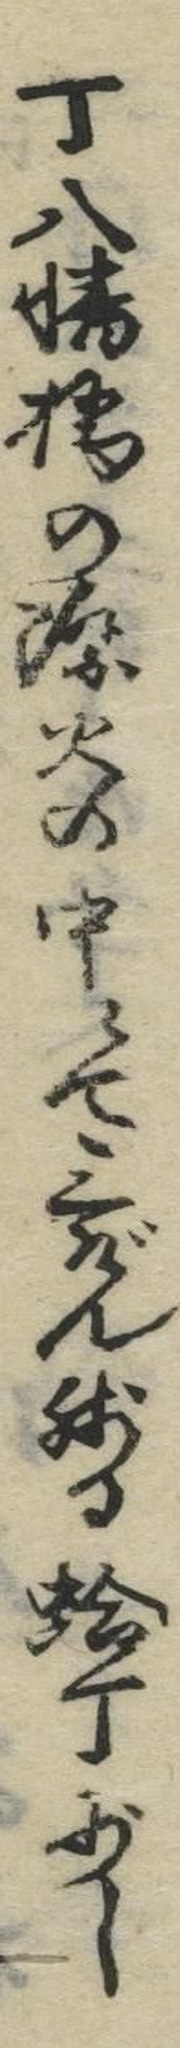丁八幡橋の際火の中二て三げん残る蛤丁少し
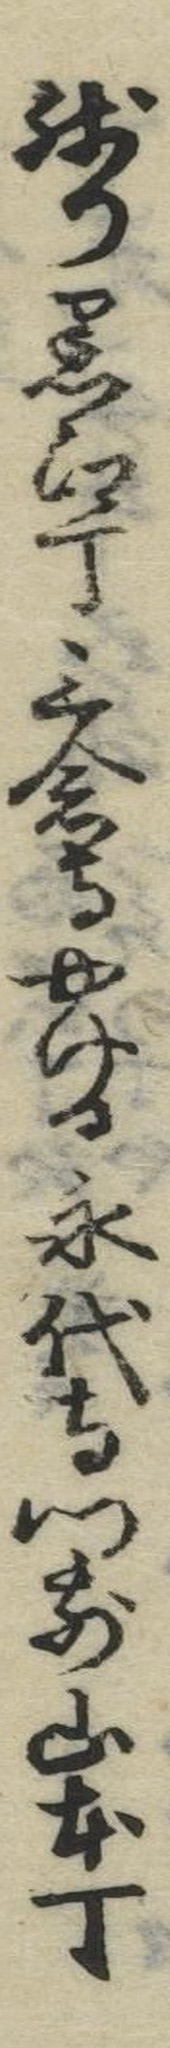残り黒江丁三念寺やける永代寺門前山本丁
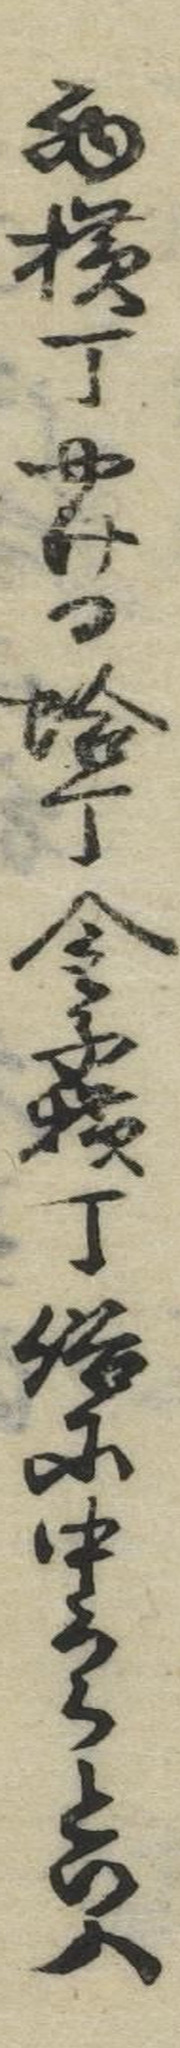西横丁やける蛤丁金子横丁俗に中うらといふ
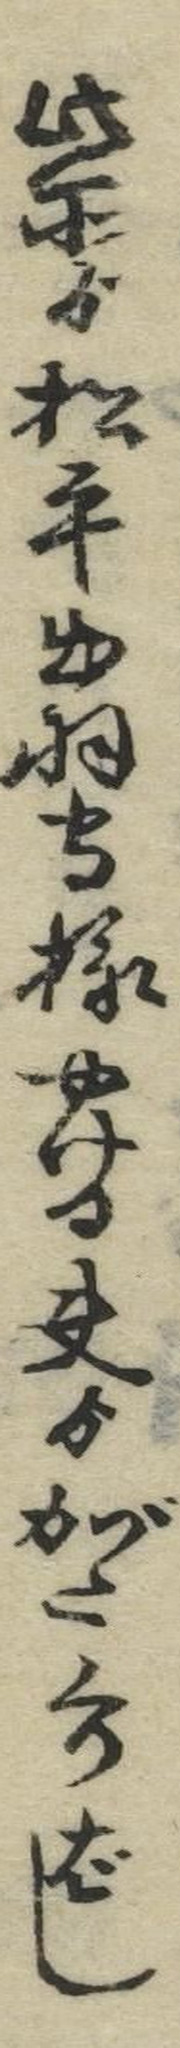此所ゟ松平出羽守様やける夫ゟかたくりばし
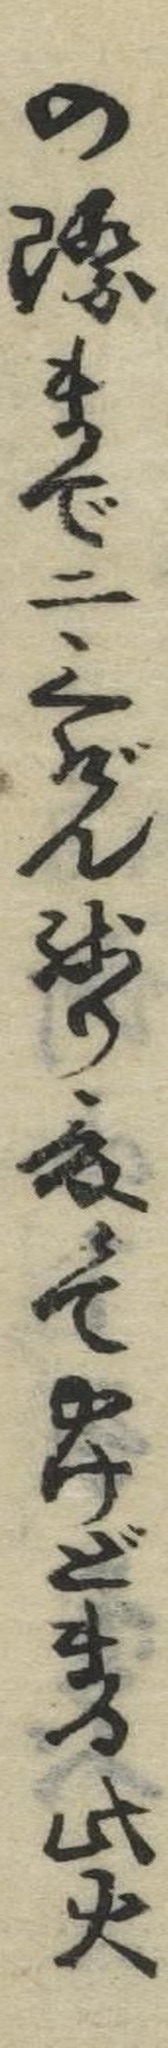の際まで二三けん残り爰二てやけどまる此火
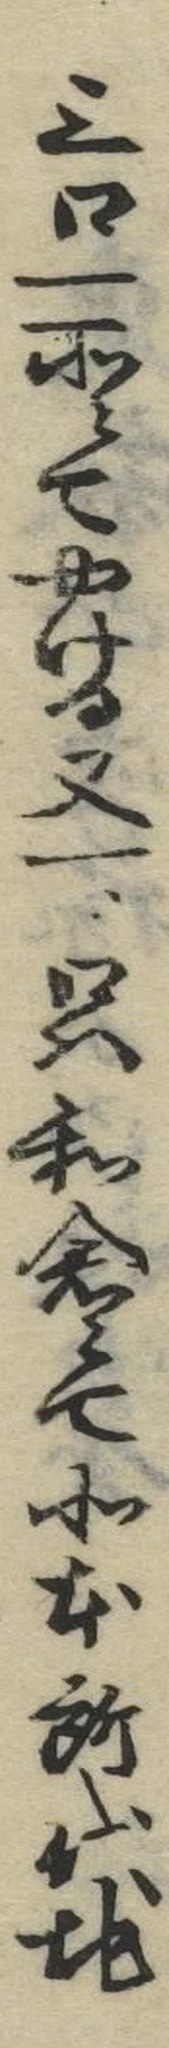三口一所二てやける又一ㇳ口ハ和倉二て北本所代地
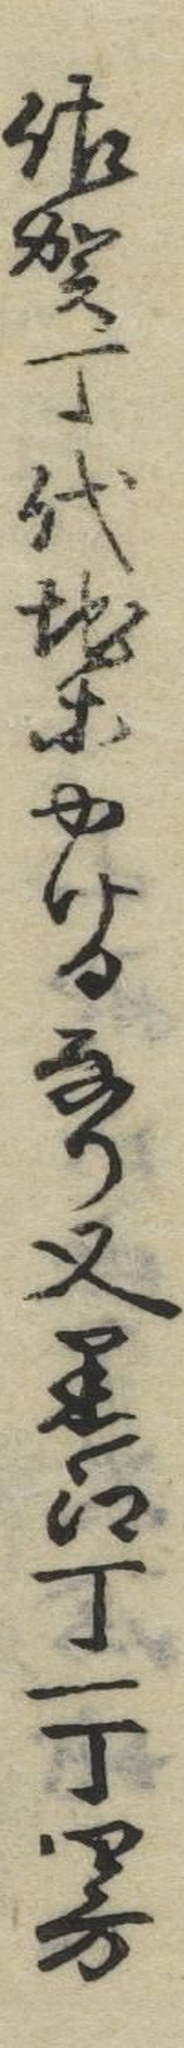佐賀丁代地等やけるなり又黒江丁一丁四方
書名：安政二卯十月二日夜四ツ時過　御府内御屋敷方市中共　地震類焼場所明細書之寫　并街道筋近郷聞書
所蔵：東京大学地震研究所図書室 Earthquake Research Institute Library, The University of Tokyo, JAPAN
